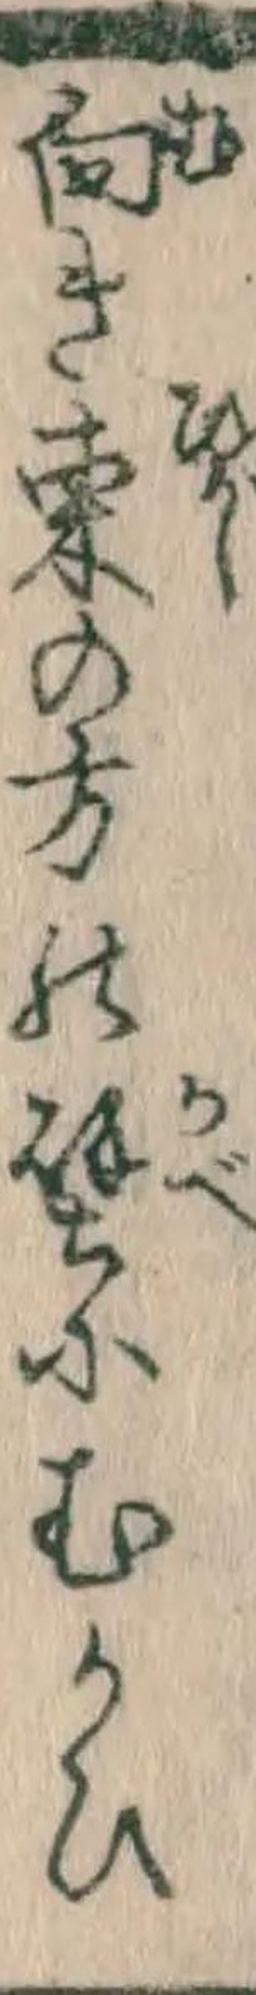向き東の方の壁にむかひ
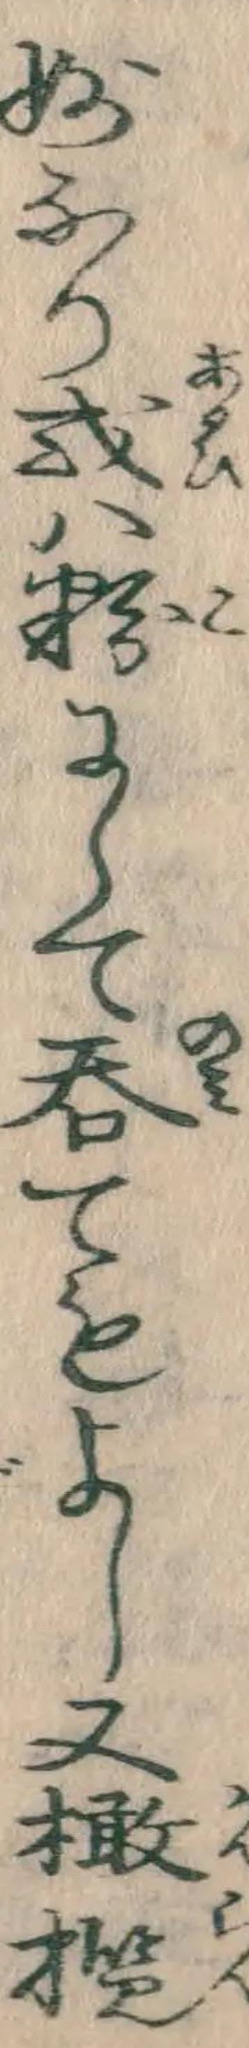妙なり或は粉にして吞てもよし又橄欖
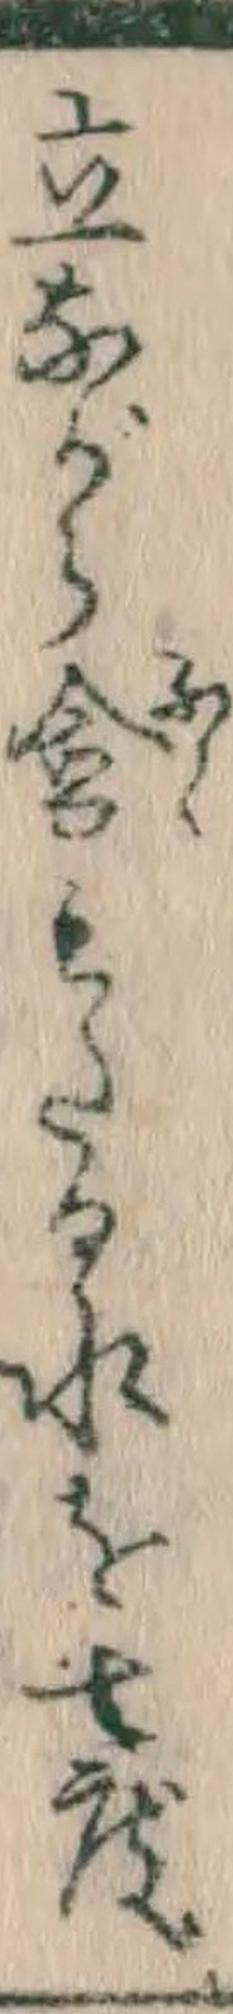立ながら含みたる水を七度
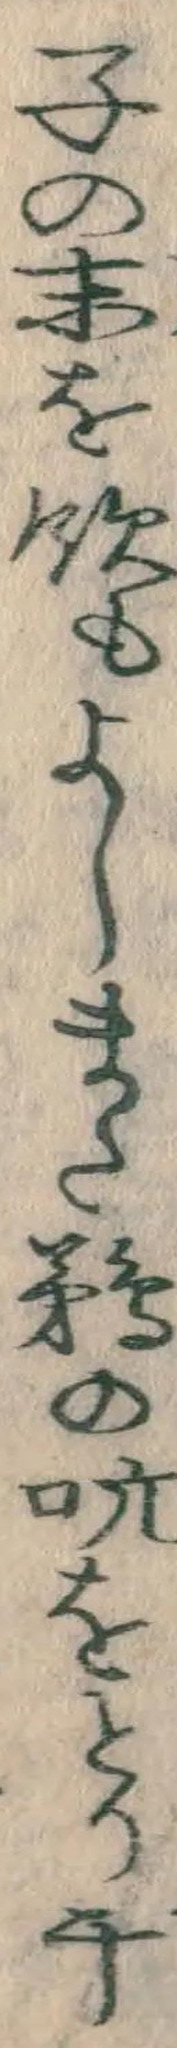子の末を飲もよしまた鵜の吭をとり干
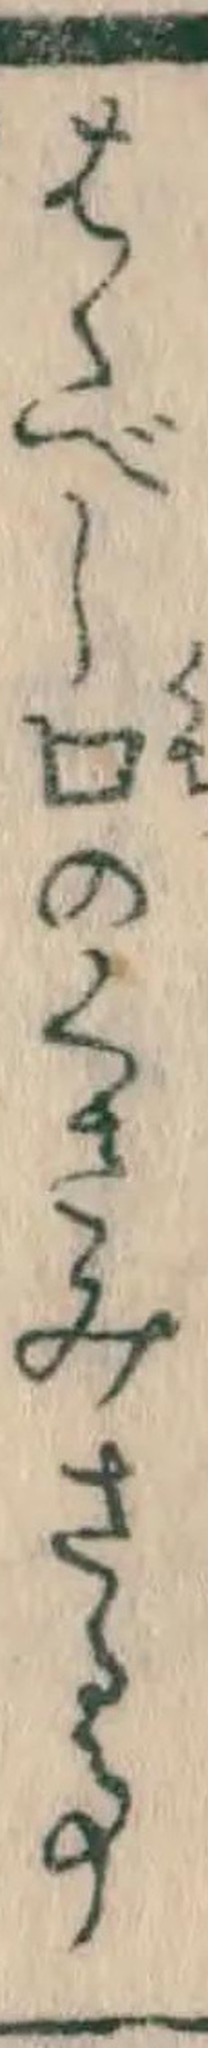はくべし口のくさみさる事
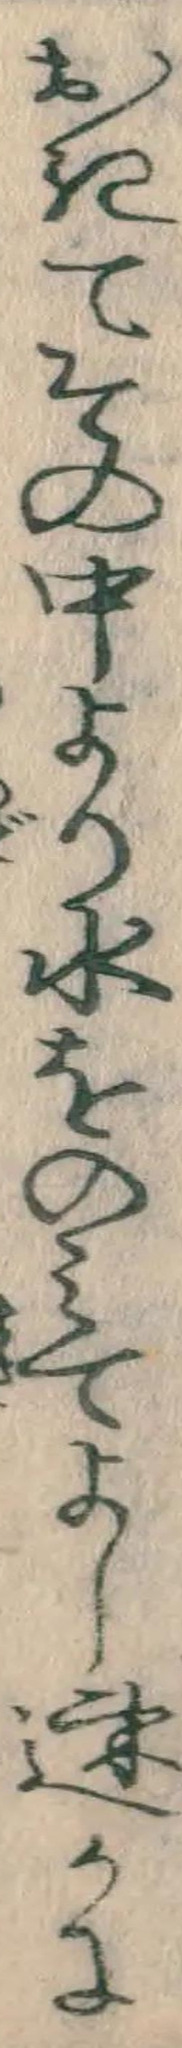おきてその中より水をのみてよし速かに
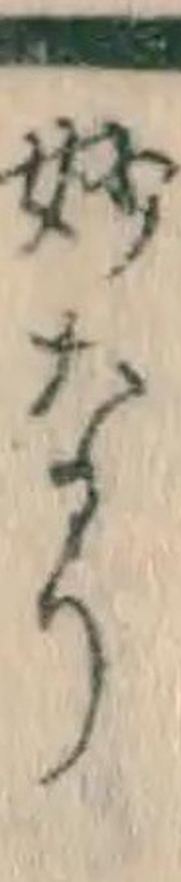妙なり
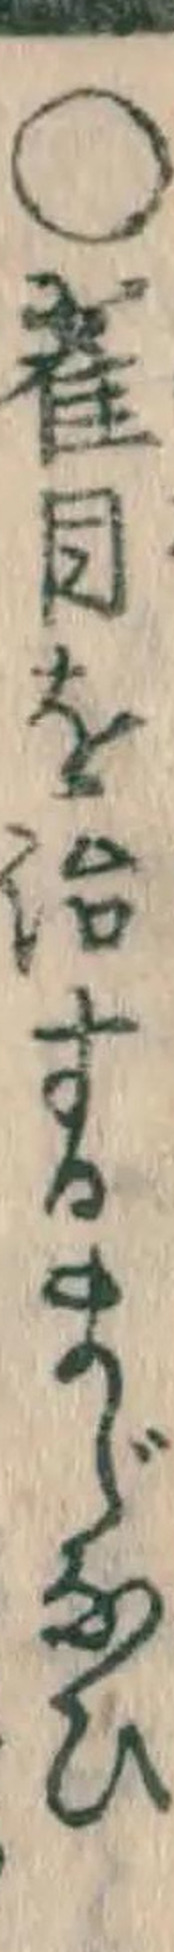○雀目を治するまじなひ
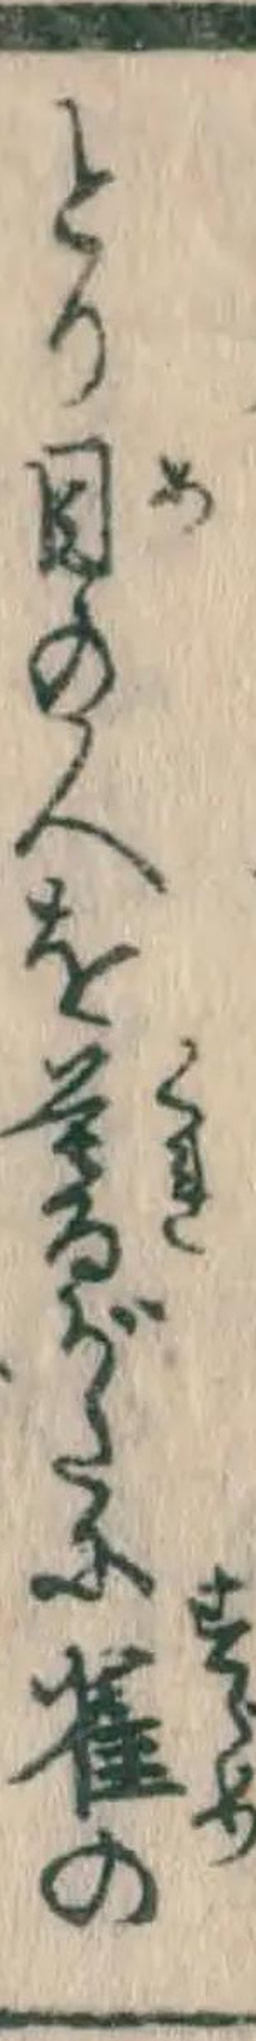とり目の人を暮がたに雀の
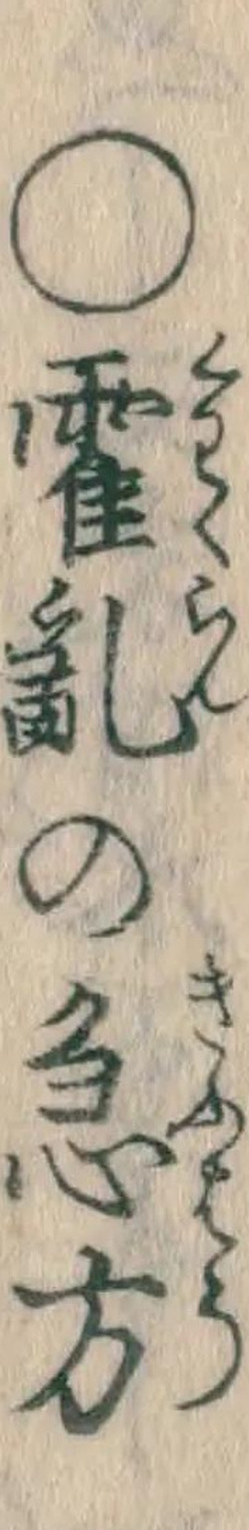○霍乱の急方
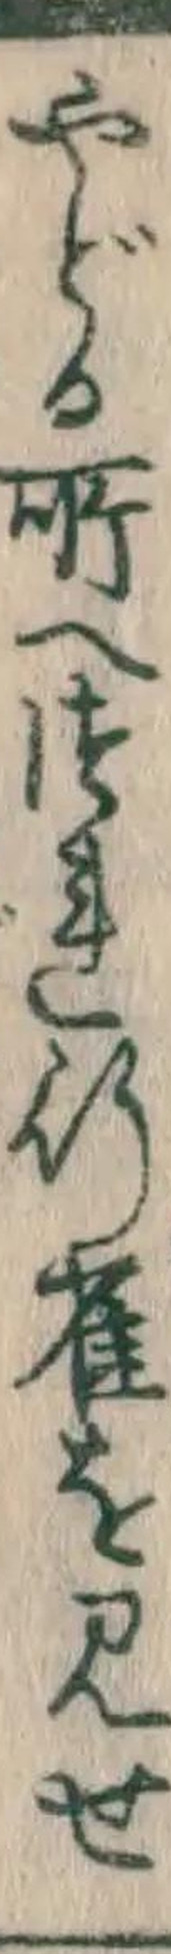やどる所へつれ行雀を見せ
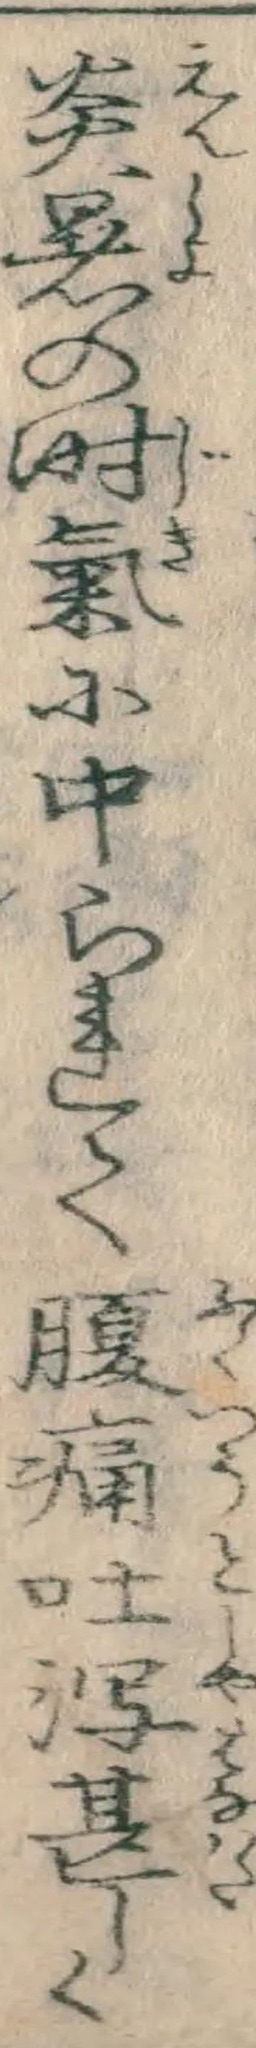炎暑の時気に中られて腹痛吐瀉甚しく
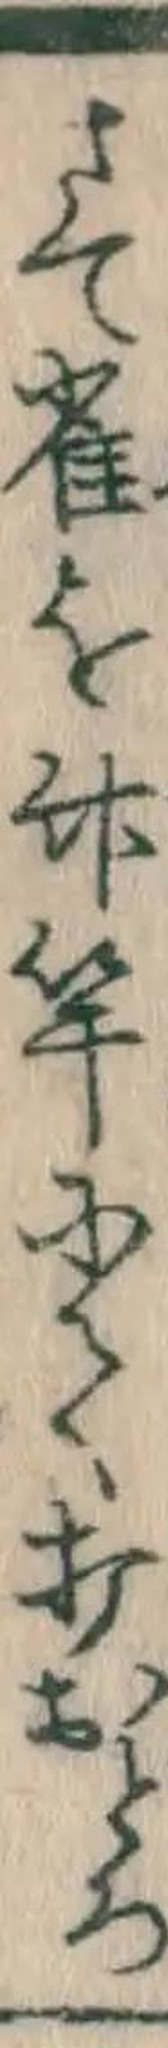さて雀を竹竿にて打おどろ
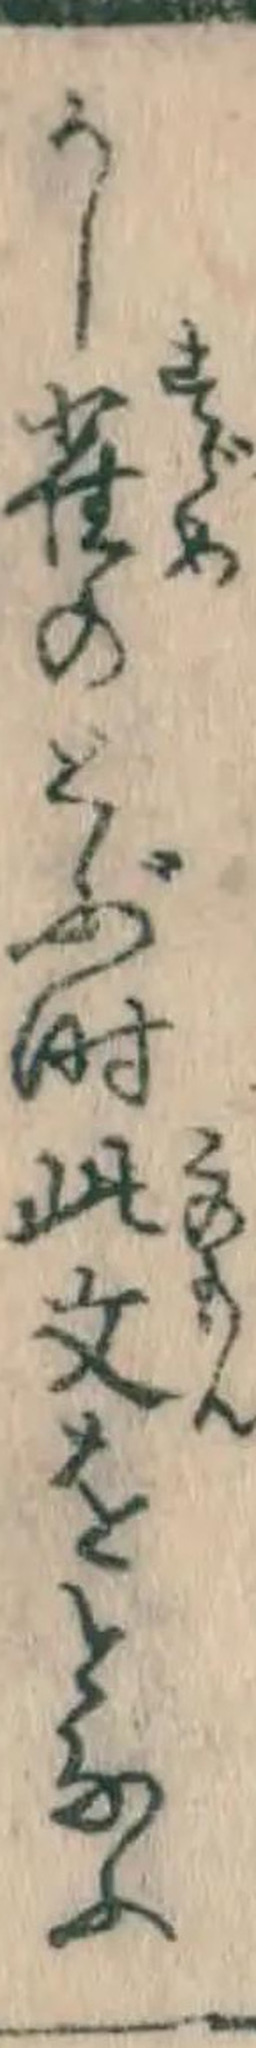かし雀のとぶ時此文をとなふ
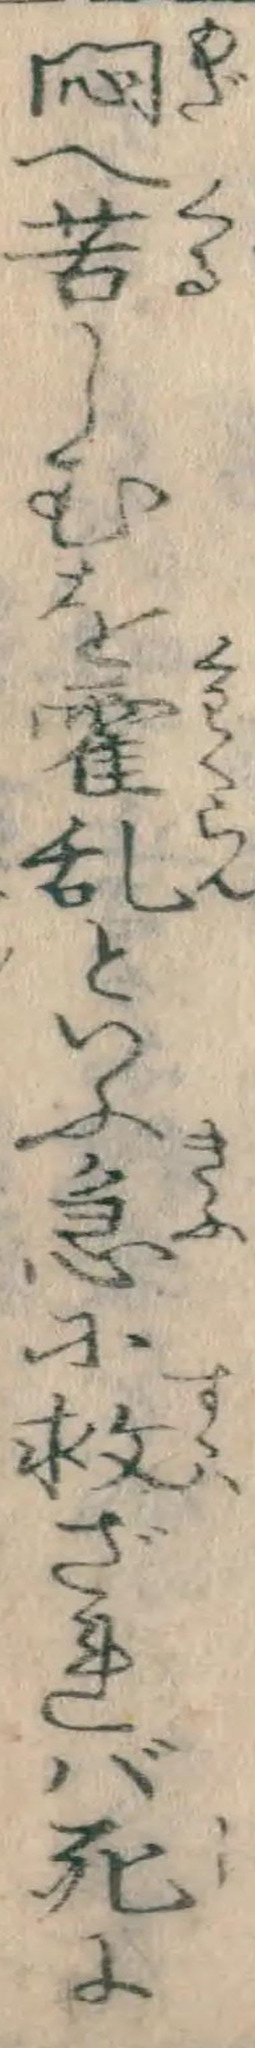悶へ苦しむを霍乱といふ急に救ざれば死に
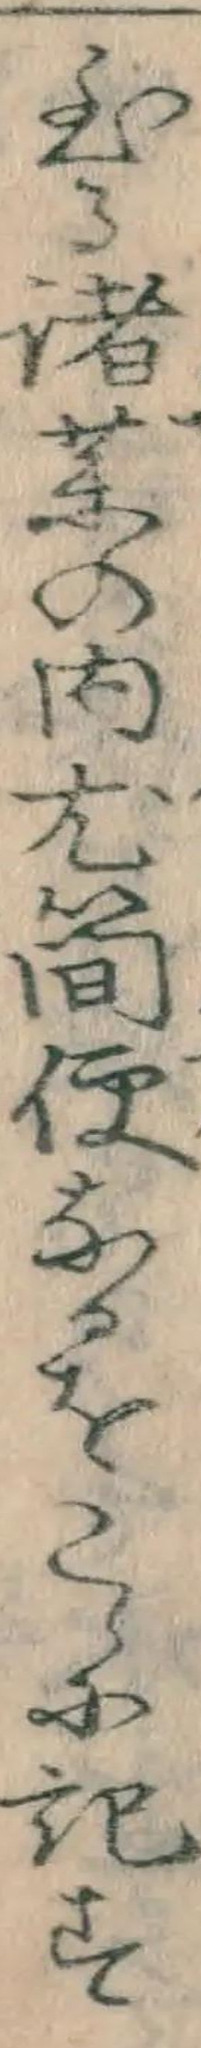至る諸薬の内尤簡便なるをこゝに記す
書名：広益秘事大全 3巻. [4]
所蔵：国立国会図書館 National Diet Library, JAPAN
